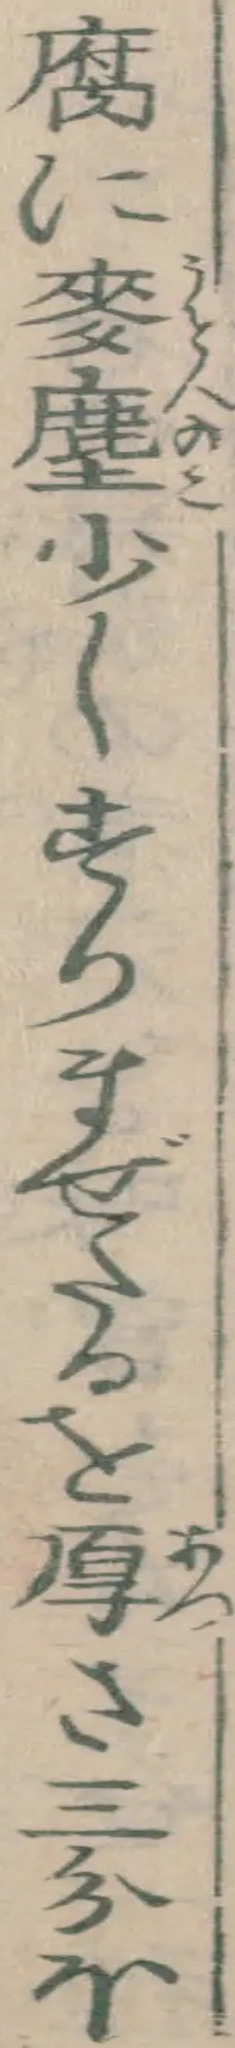腐に麦塵少しすりまぜたるを厚さ三分ほ
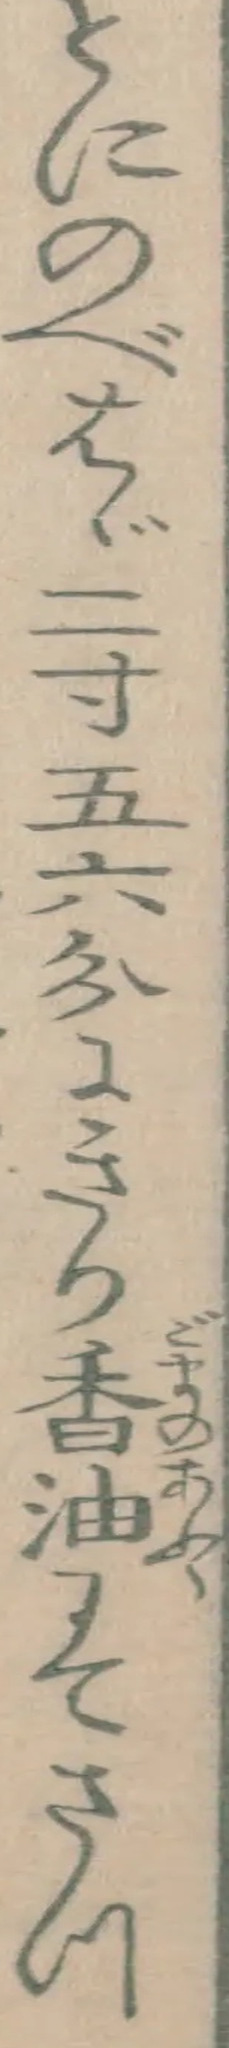とにのべはゞ二寸五六分にきり香油にてさつ
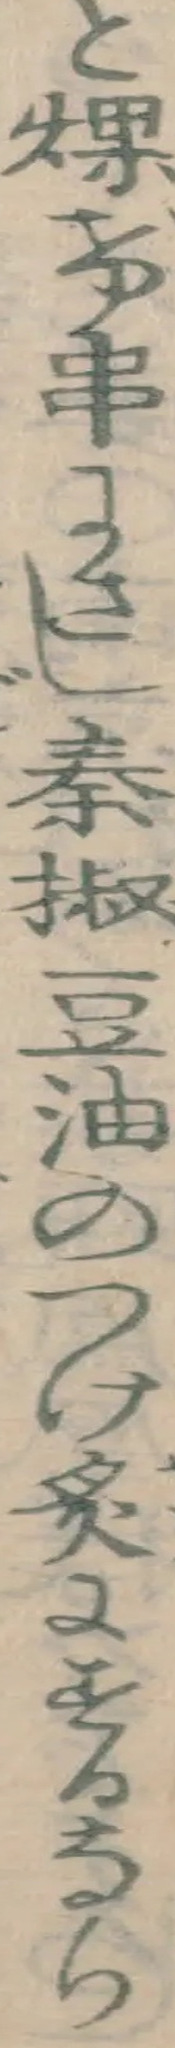と煠げ串にさし秦椒豆油のつけ炙にするなり
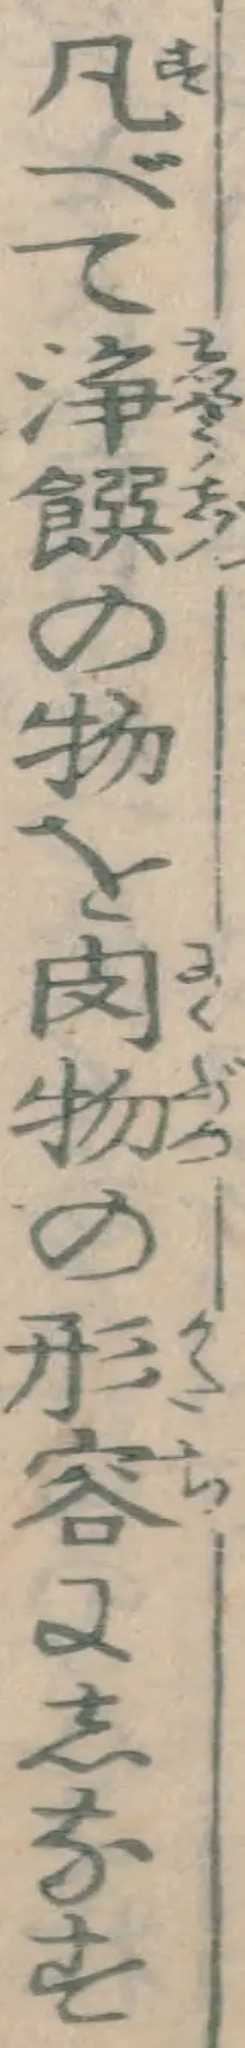凡べて浄饌の物を肉物の形容にしなす
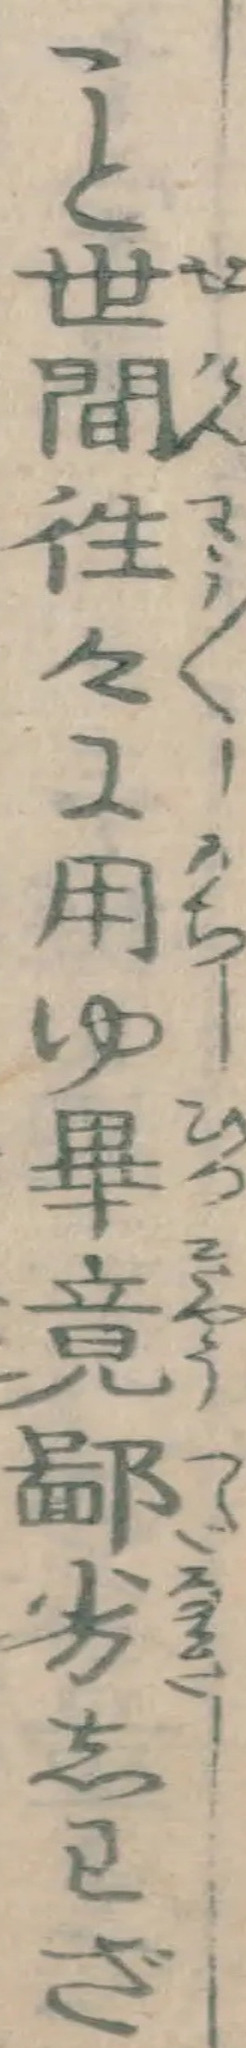こと世間往々に用ゆ畢竟鄙劣しわざ
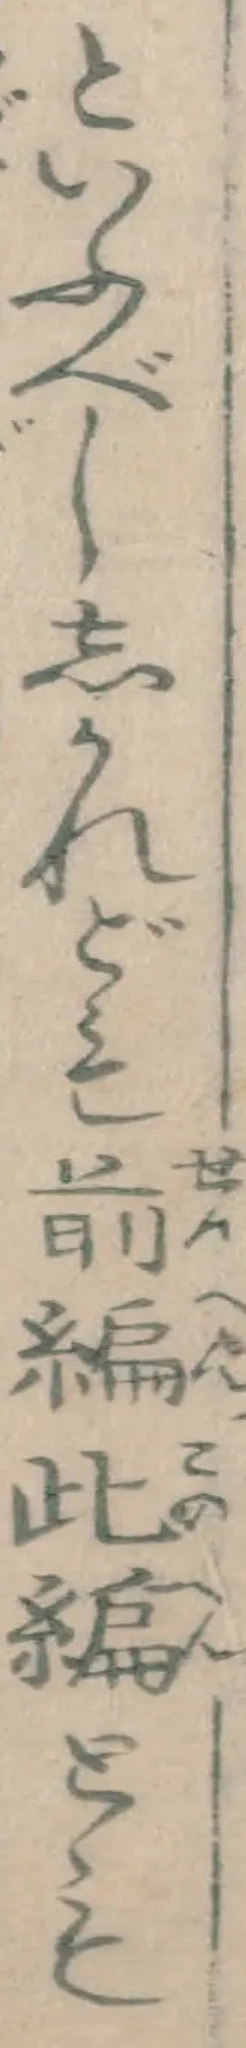といふべししかれども前編此編とも
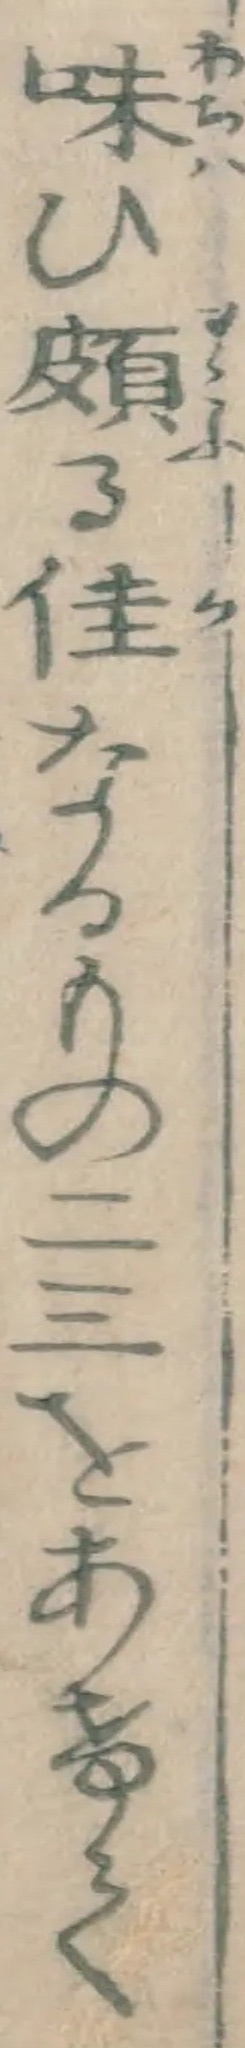味ひ頗る佳なるもの二三をあけて
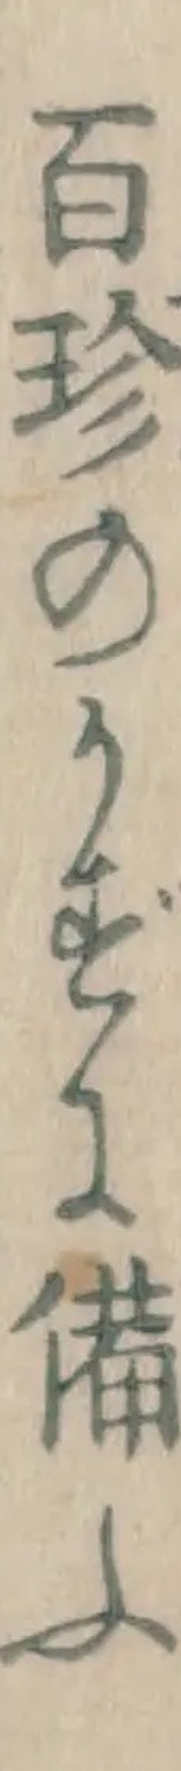百珍のかずに備ふ
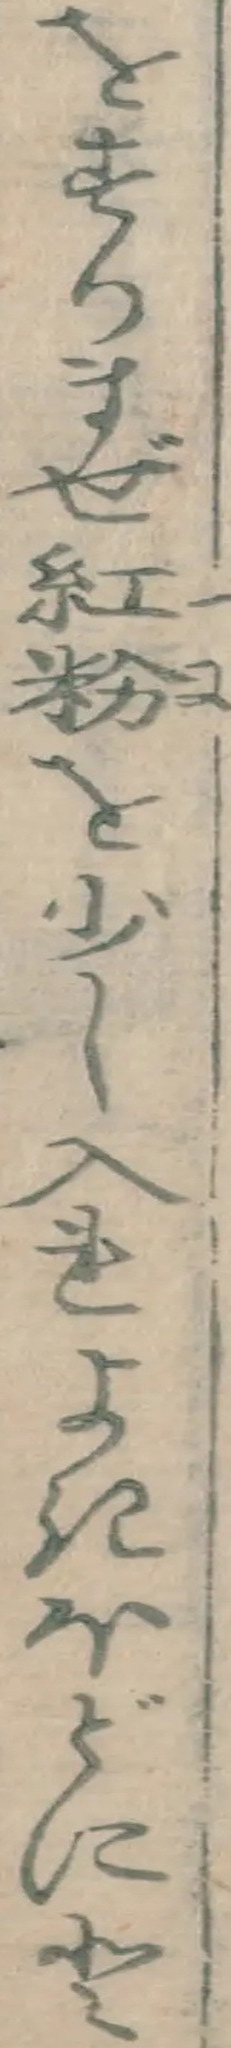をすりまぜ紅粉を少し入れよきほどにと

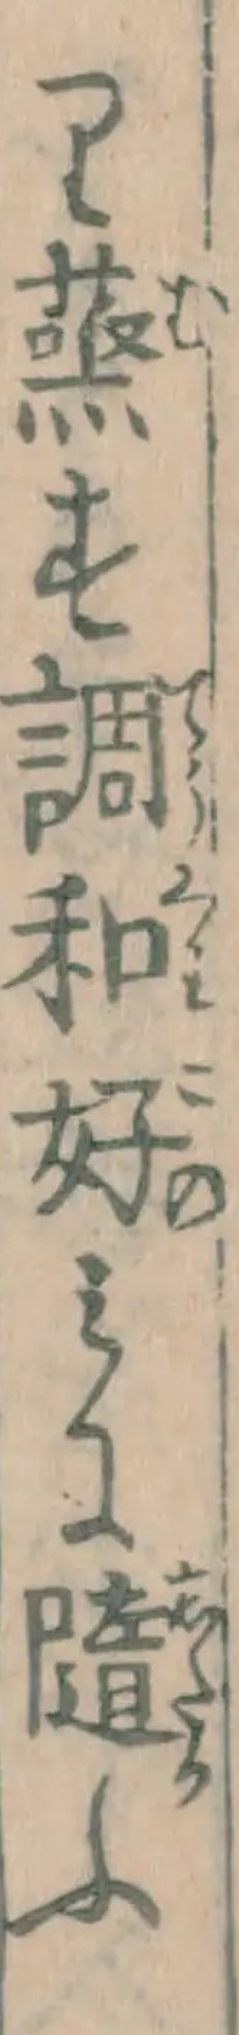り蒸す調和好みに随ふ
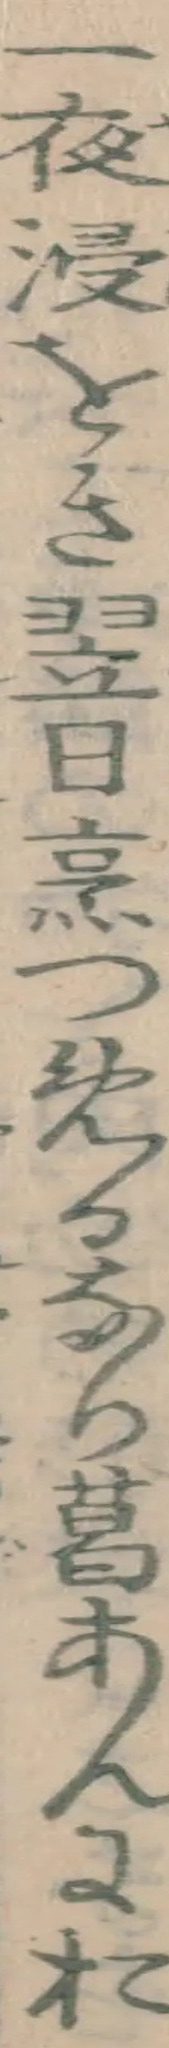一夜浸をき翌日烹つめるなり葛あんにお
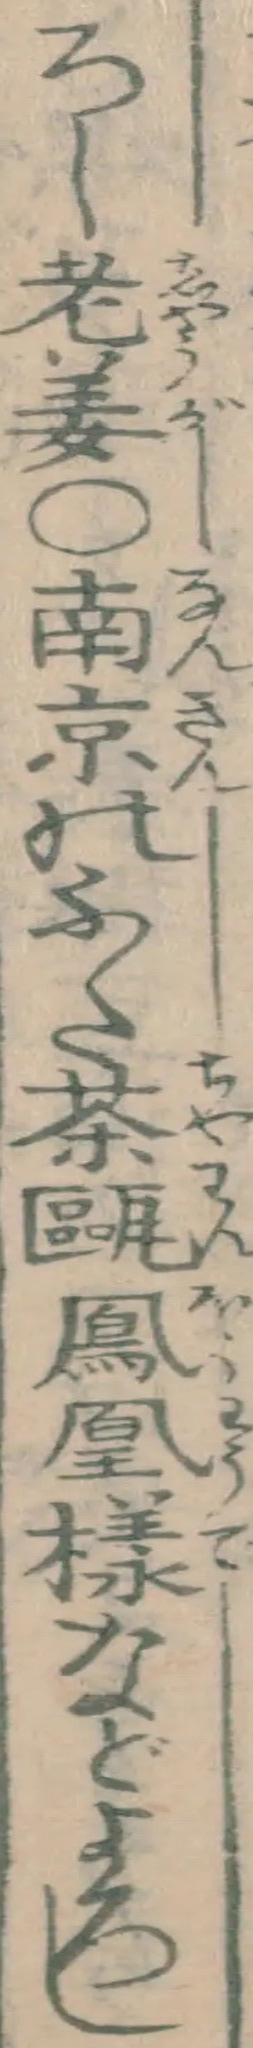ろし老姜○南京のふた茶甌鳳凰様なとよろし
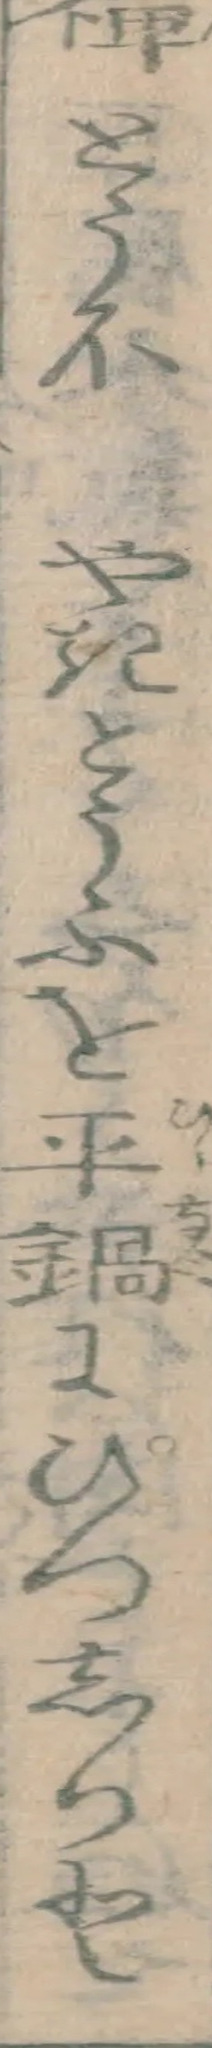八十禅とうふやきとうふを平鍋にひつしりと
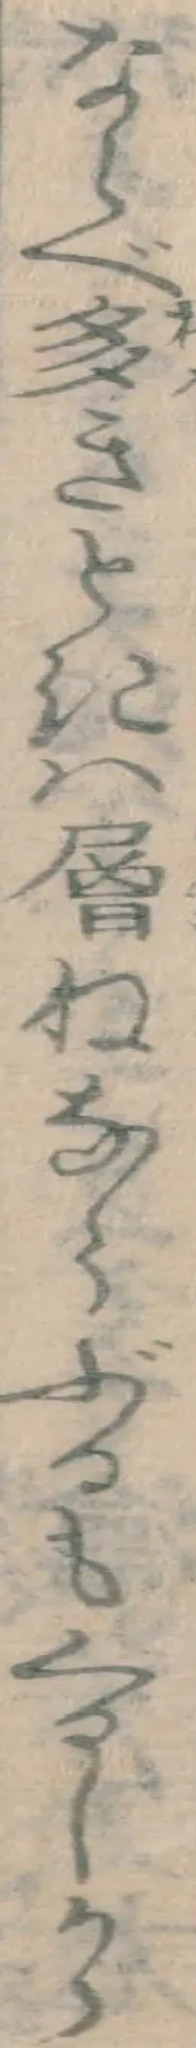ならべ多きときは層ねならぶるもくるしから
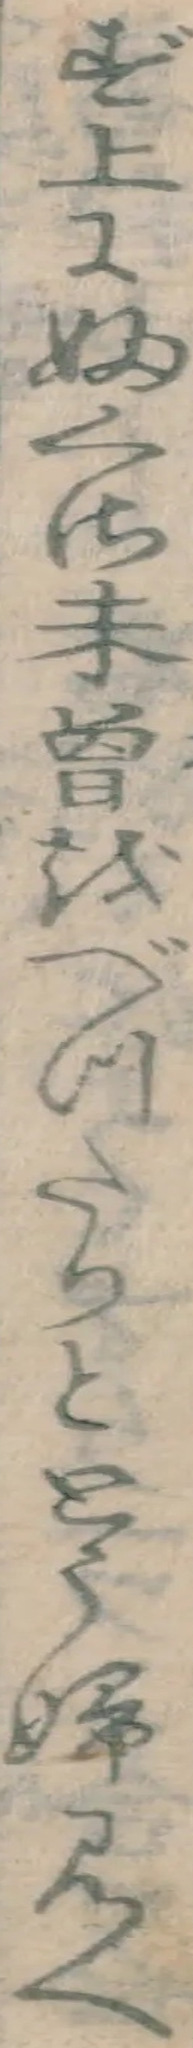ず上にふくさ未曽をべつたりととうふ見へ
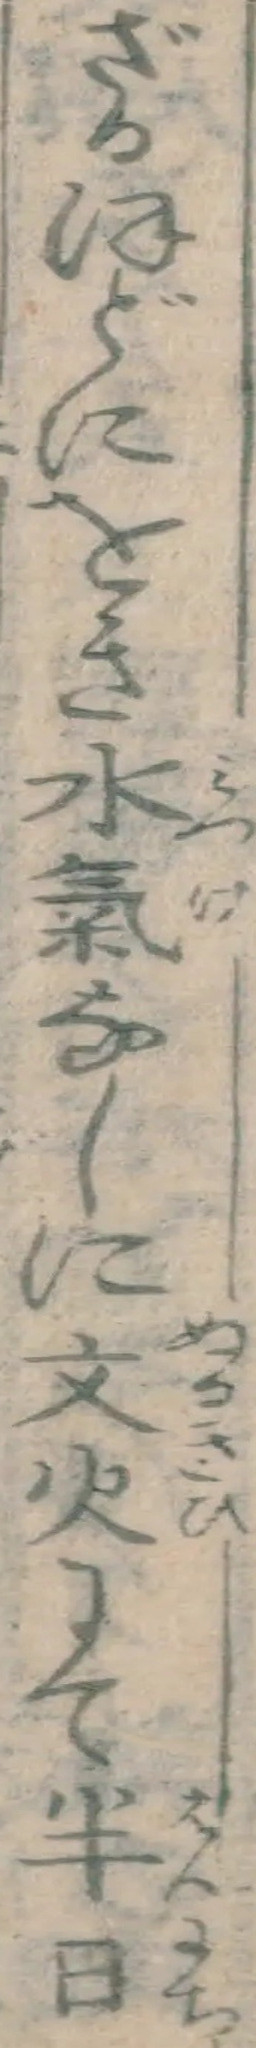ざるほどにをき水気なしに文火にて半日
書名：豆腐百珍. 続編
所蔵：国立国会図書館 National Diet Library, JAPAN
